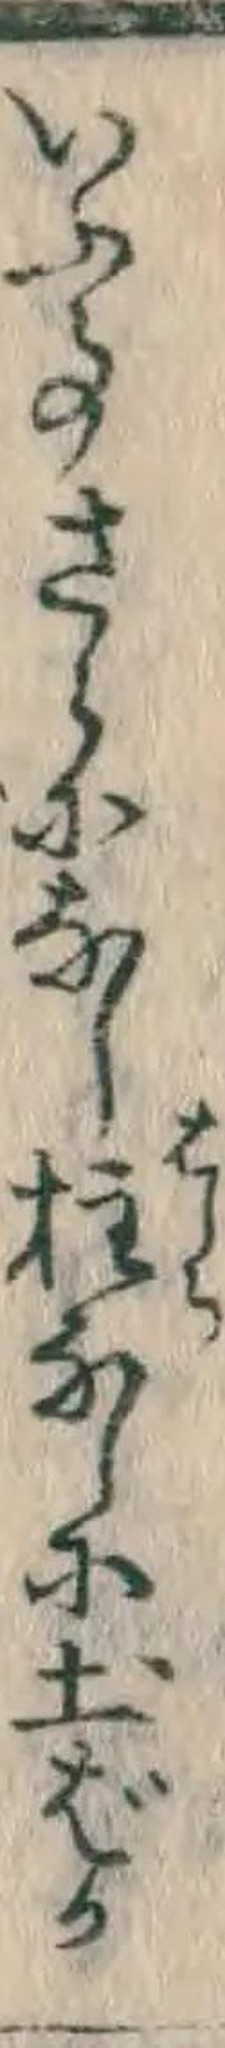いふ事さらになし柱なしに土ばか
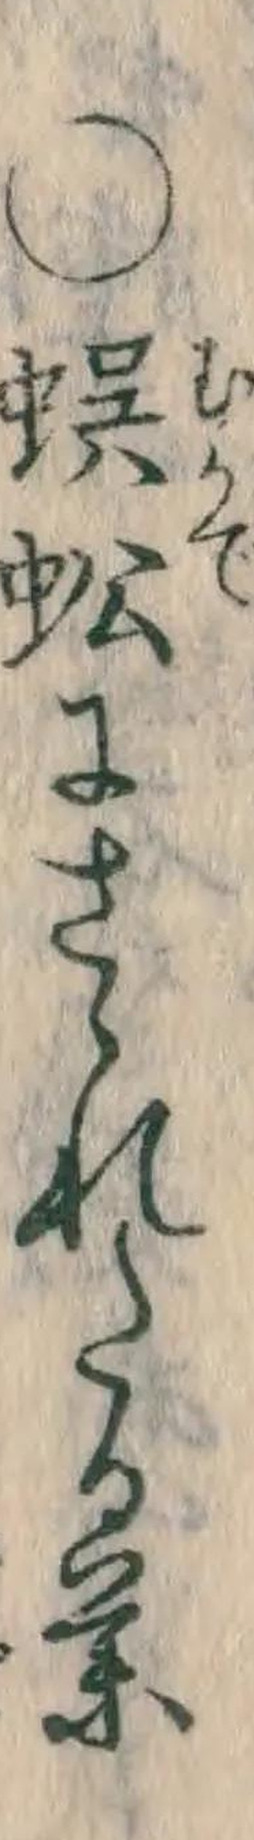○蜈蚣にさゝれたる薬
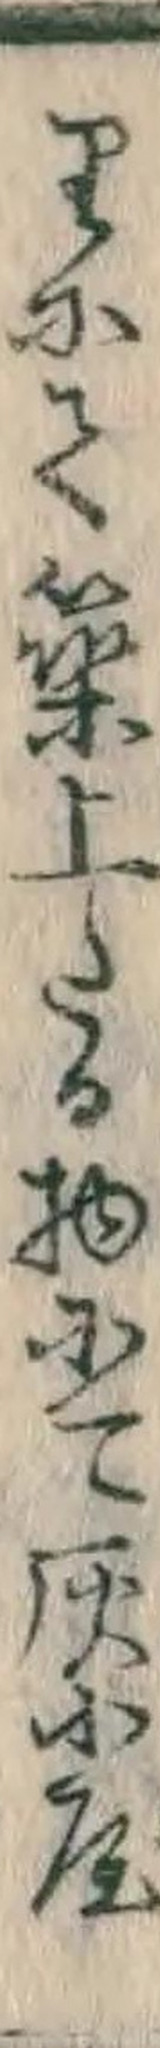りにて築上たる物にて灰小屋
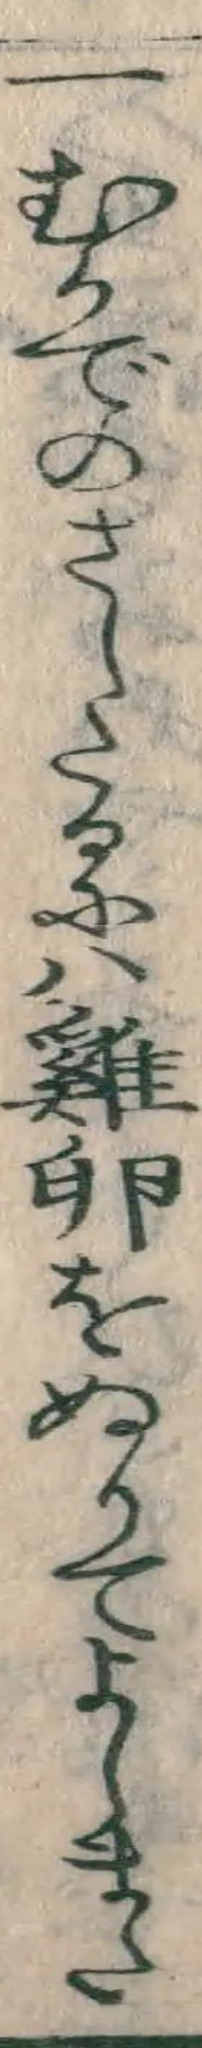一むかでのさしたるには鶏卵をぬりてよしまた
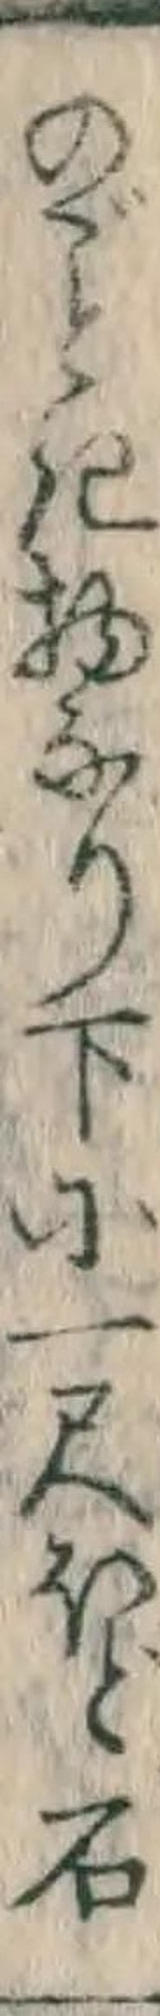のごとき物なり下に一尺ほど石
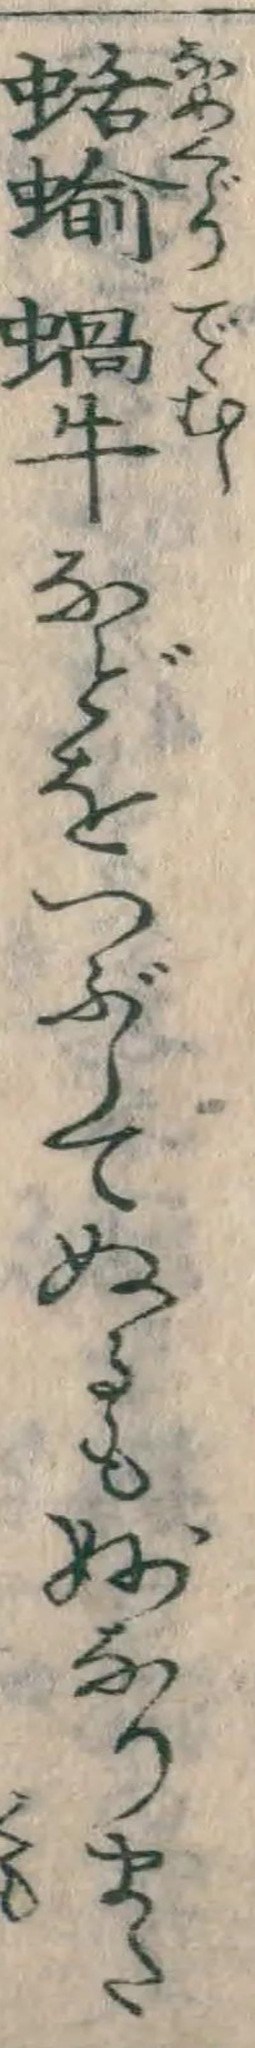蛞蝓蝸牛などをつぶしてぬるも妙なりまた
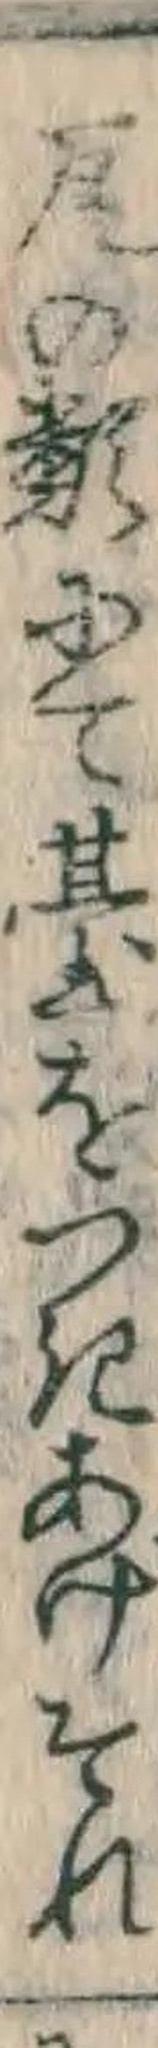瓦の類にて台をつきあげそれ
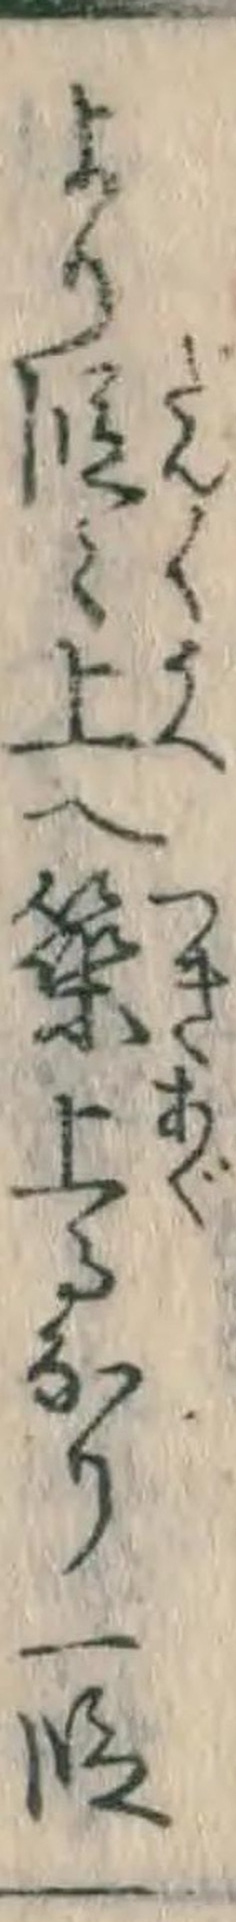より段々上へ築上るなり一段
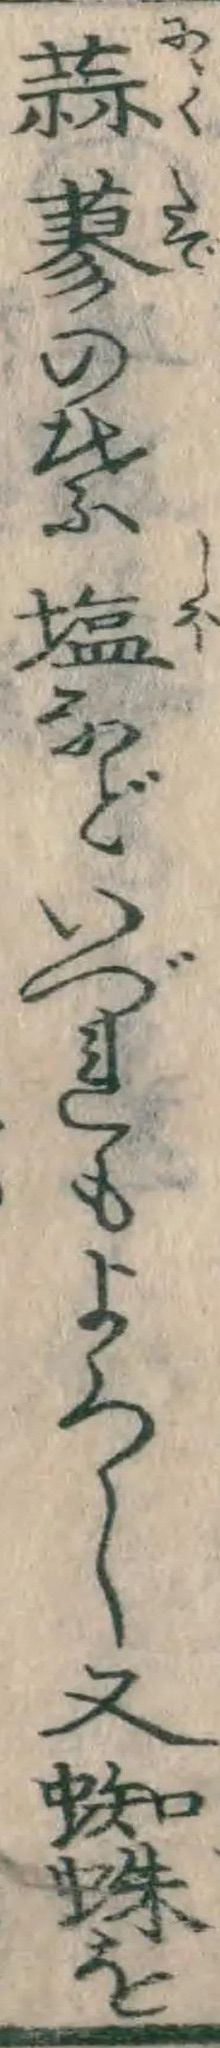蒜蓼の葉塩などいづれもよろし又蜘蛛を
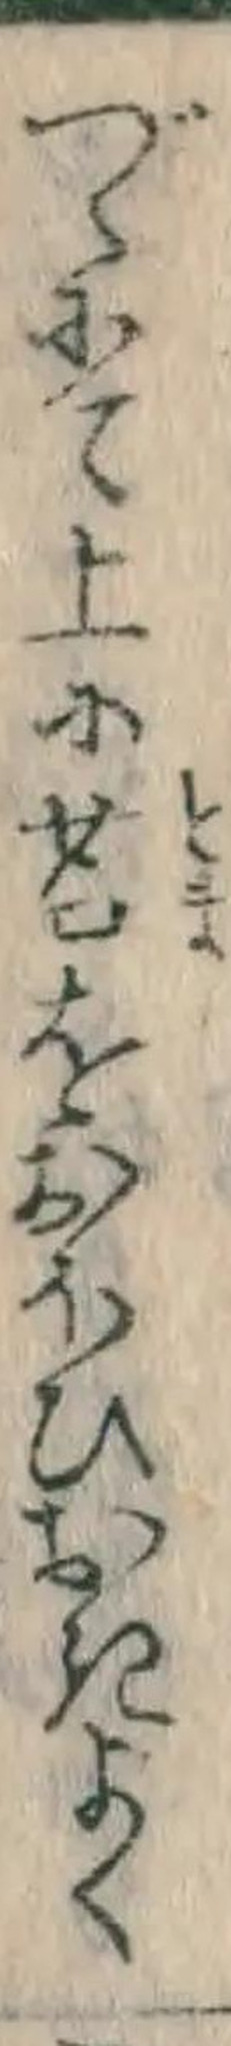づゝにて上に苫をおほひおきよく
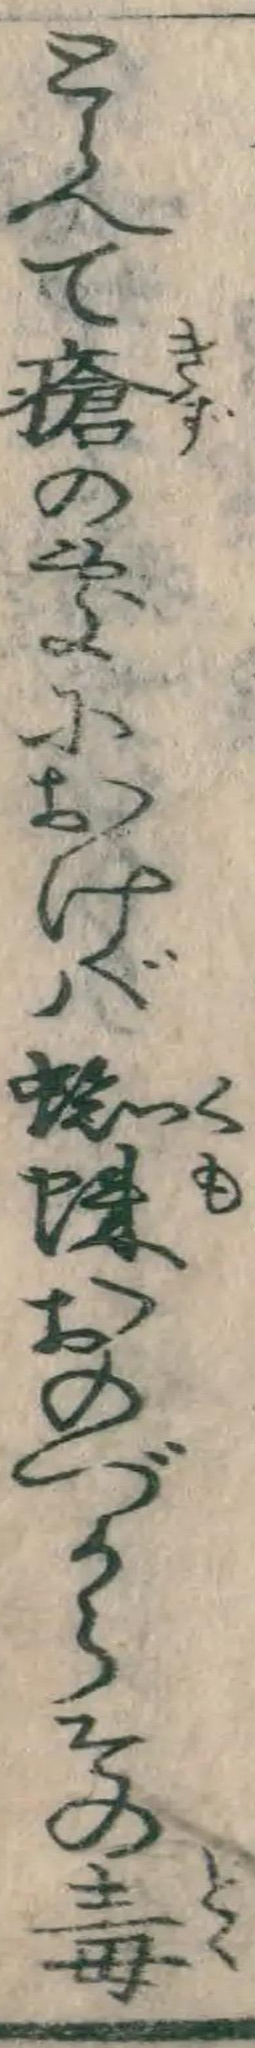とらへて瘡の處におけば蜘蛛おのづからその毒

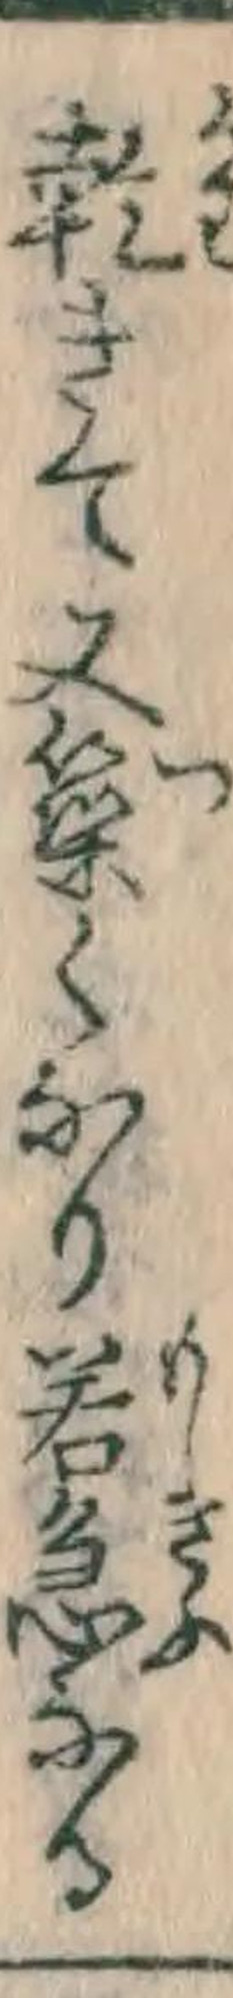乾きて又築くなり若急なる
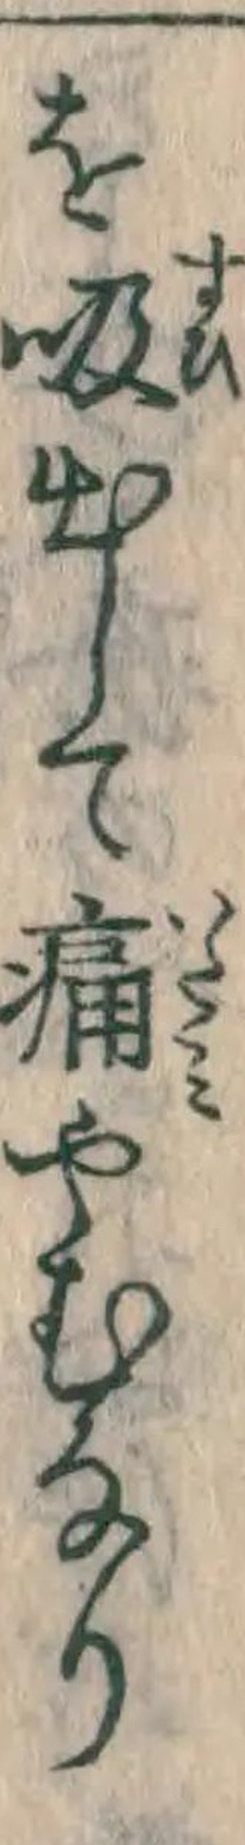を吸出して痛やむなり
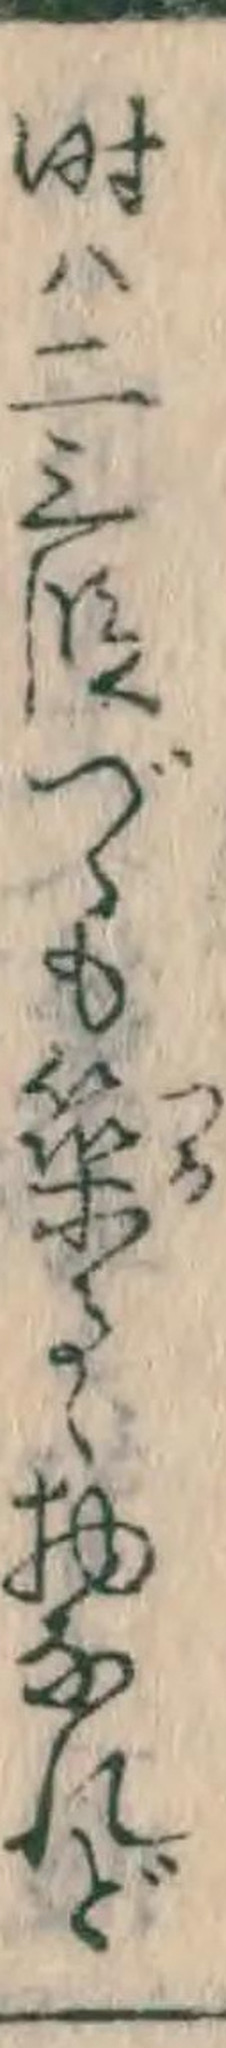時は二三段づゝも築るゝ物なれど
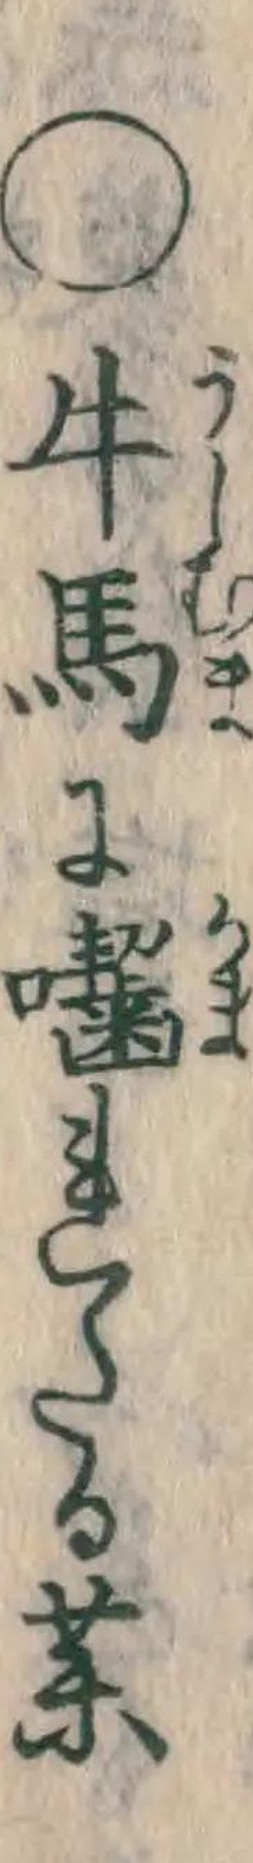○牛馬に噛れたる薬
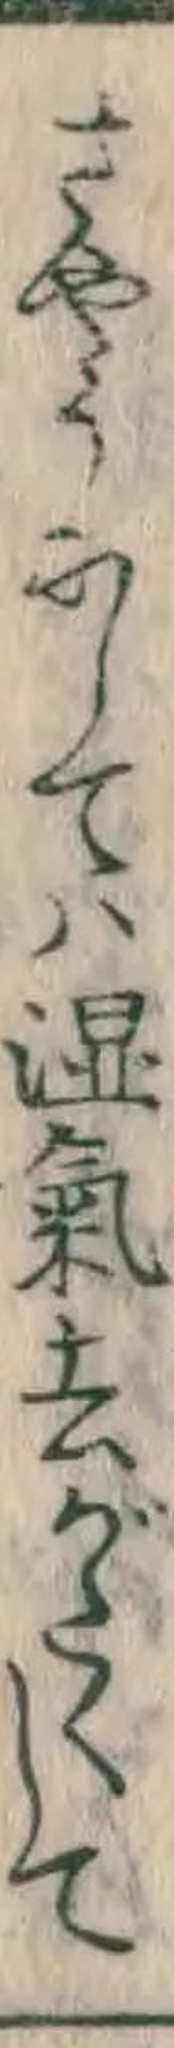さやうにしては湿気去がたくして
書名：広益秘事大全 3巻. [3]
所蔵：国立国会図書館 National Diet Library, JAPAN
